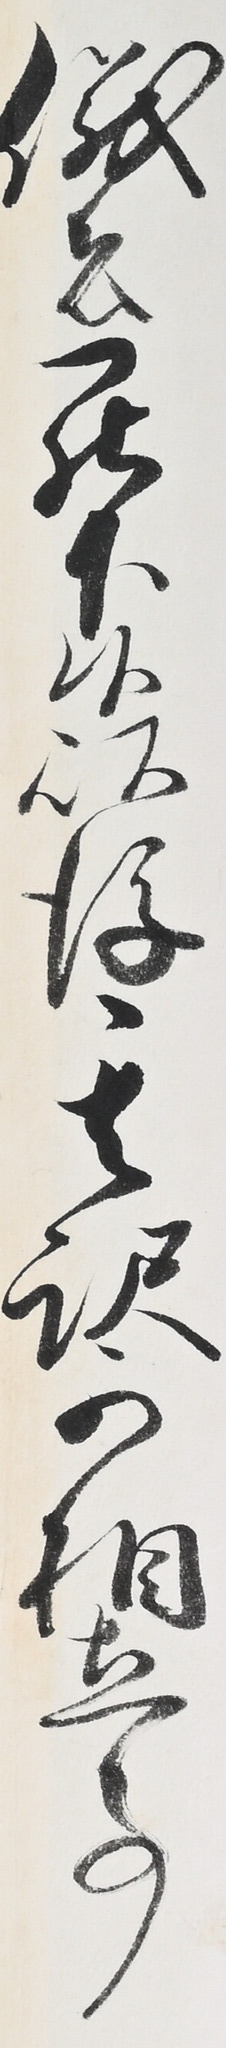儀者罷下候以後其訳可相立事
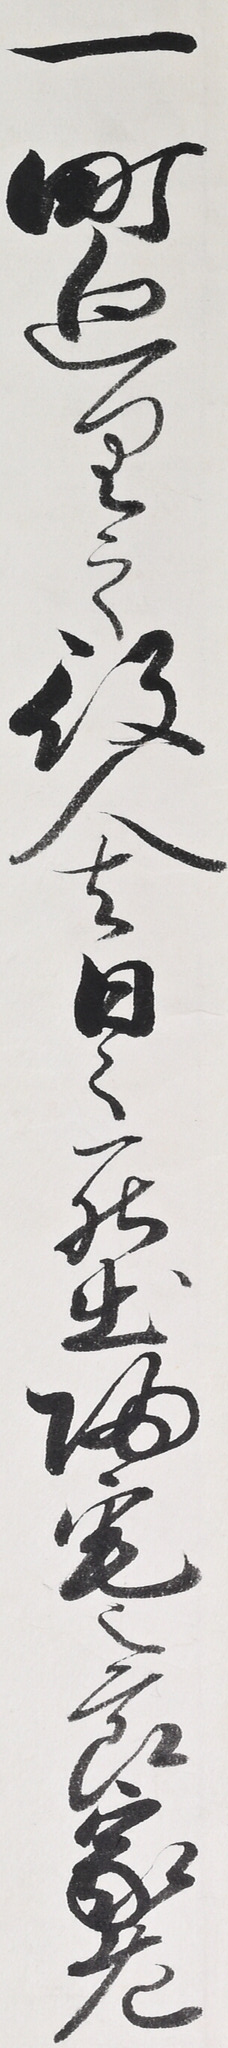一町廻り之役人者日々罷出帰宅之節家老
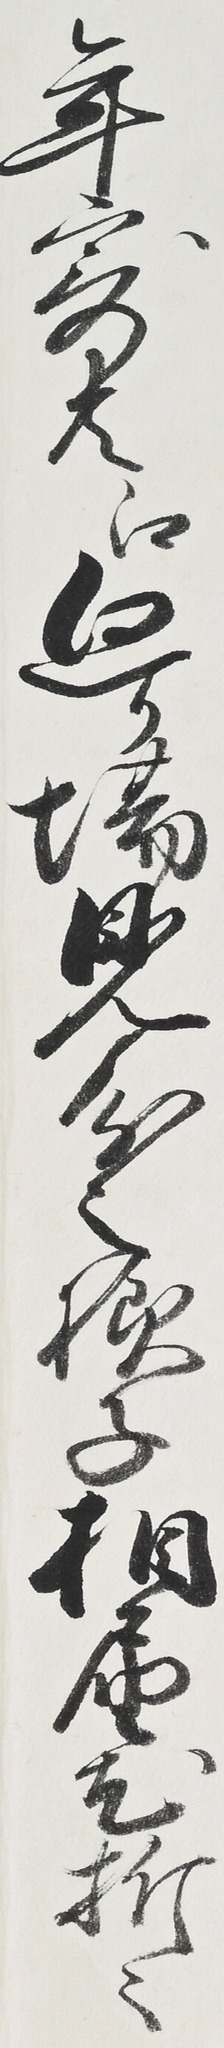年寄共江廻り場見分之様子相届尤折々
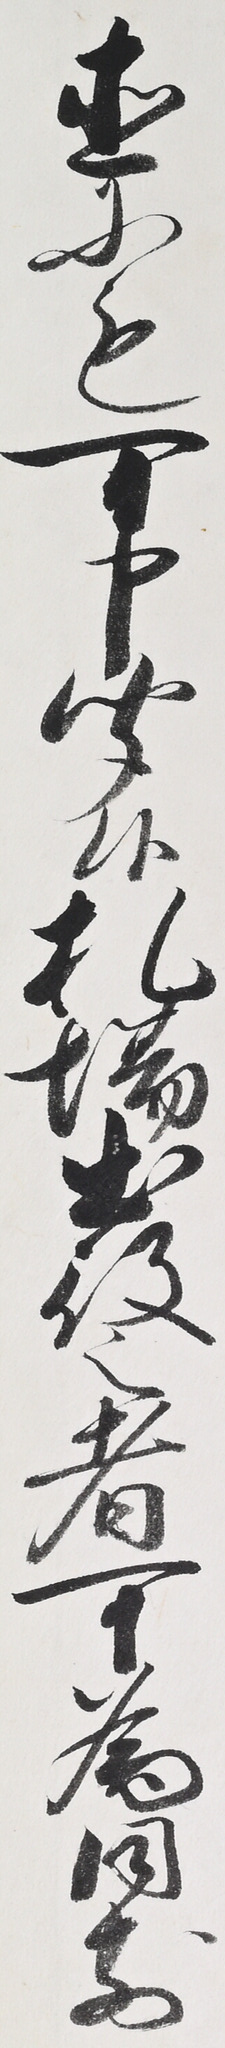直にも可申聞候札場出役之者可為同前
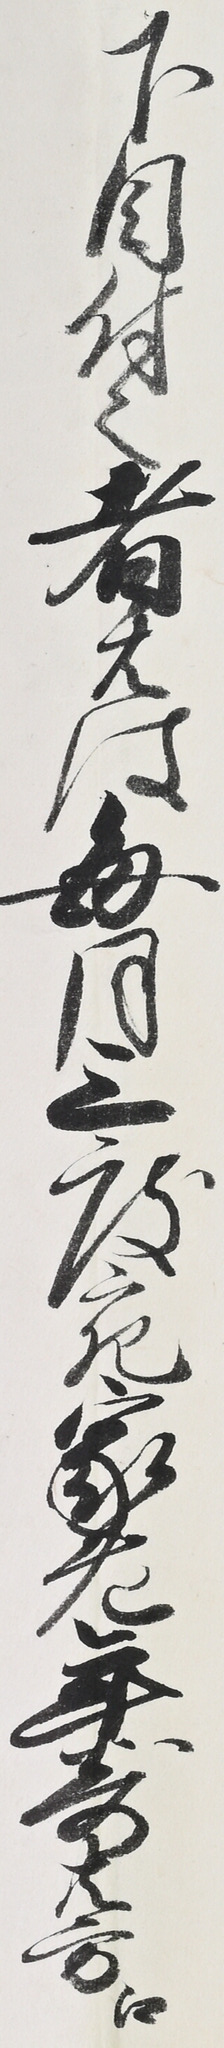下目付之者共は毎月三度宛家老年寄共方江
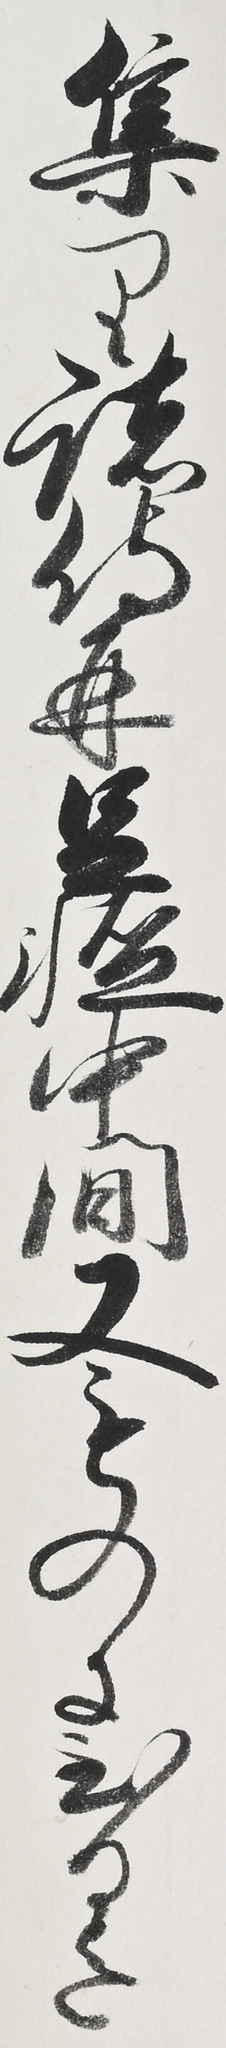集り諸侍并足軽中間又ものに至る迄
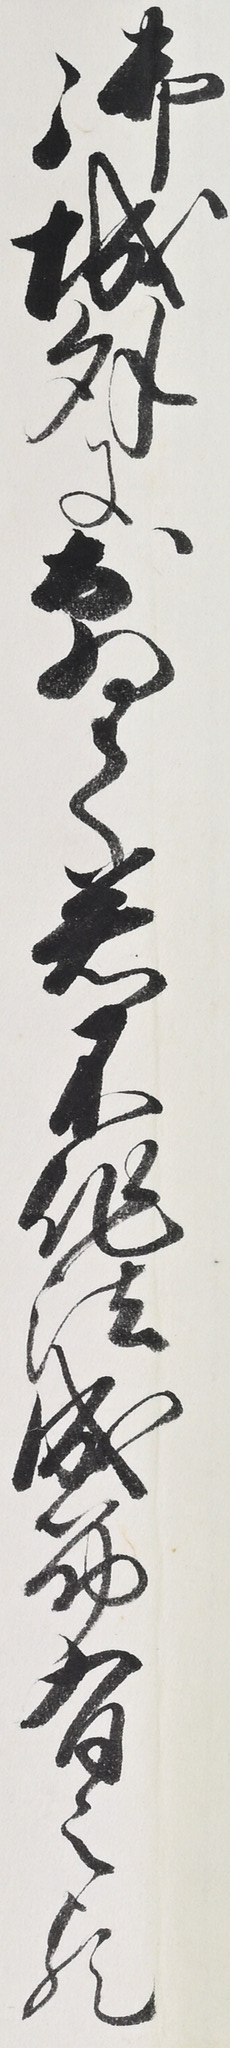御城外におゐて若不作法成筋有之歟
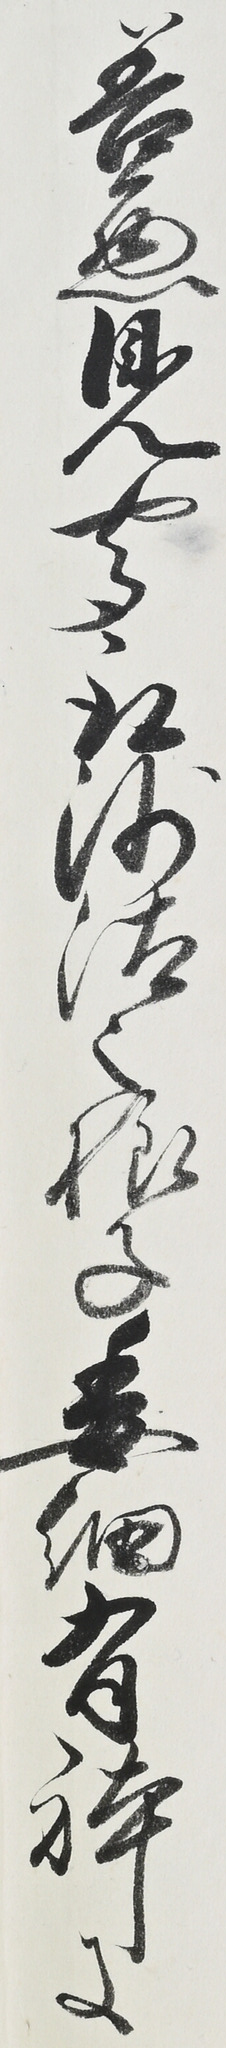善悪見聞取沙汰之様子委細有躰に
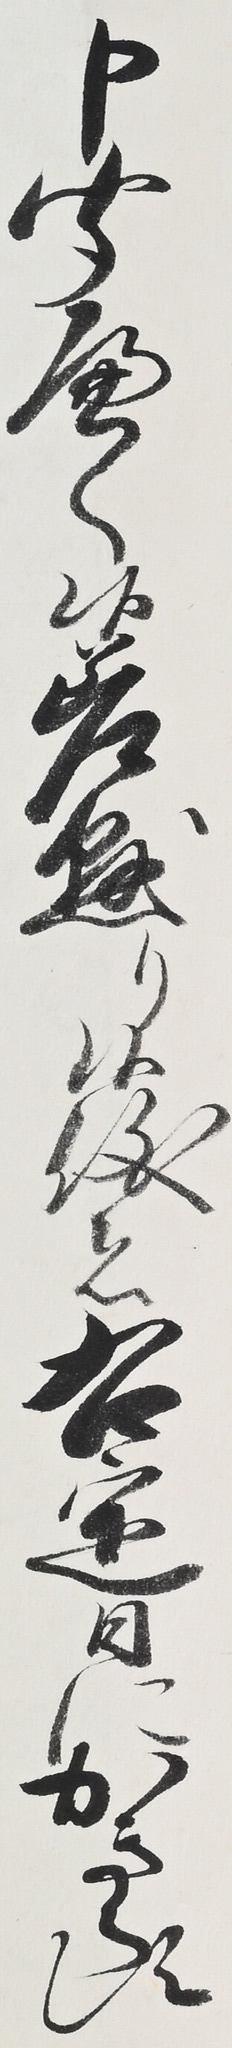申聞へく候差懸り候儀者右定日にかきらす
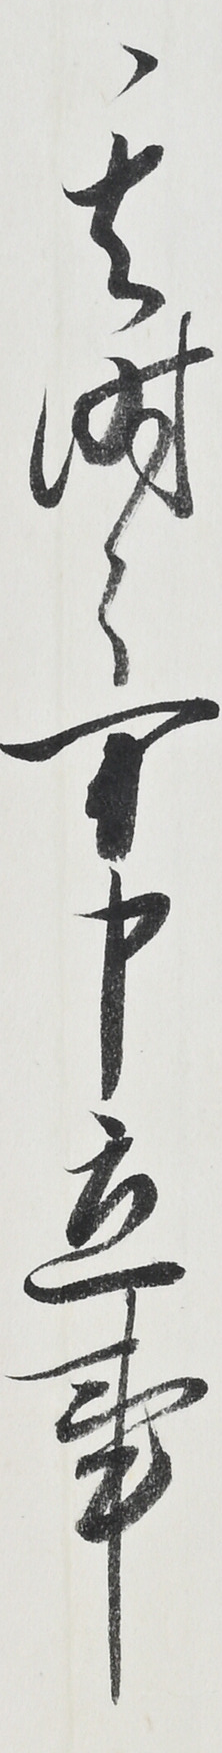其時々可申立事
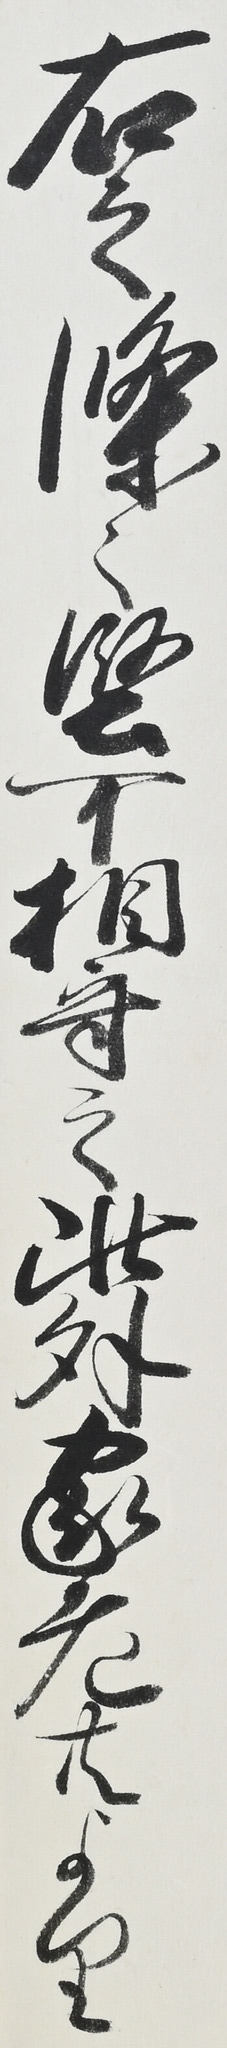右之條々堅可相守之此外家老共より

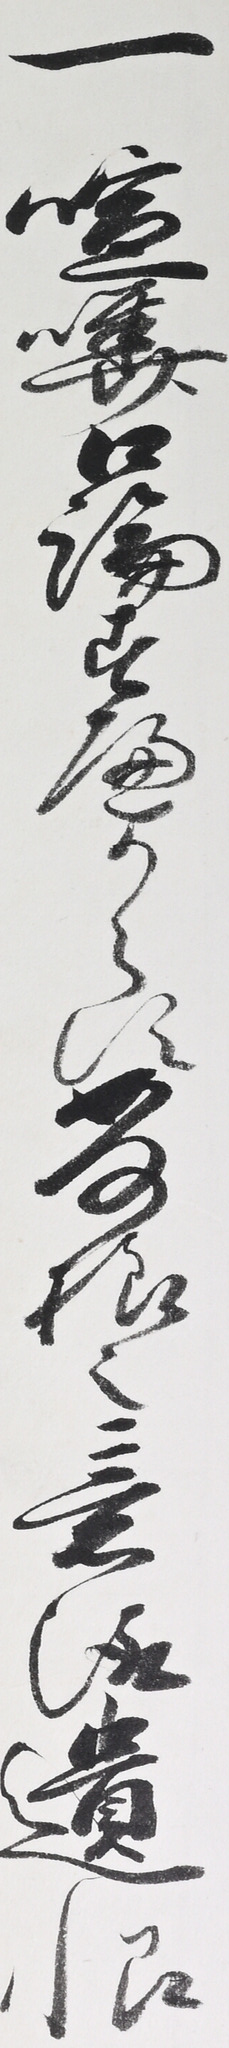一喧嘩口論すへからす如何様之意趣遺恨
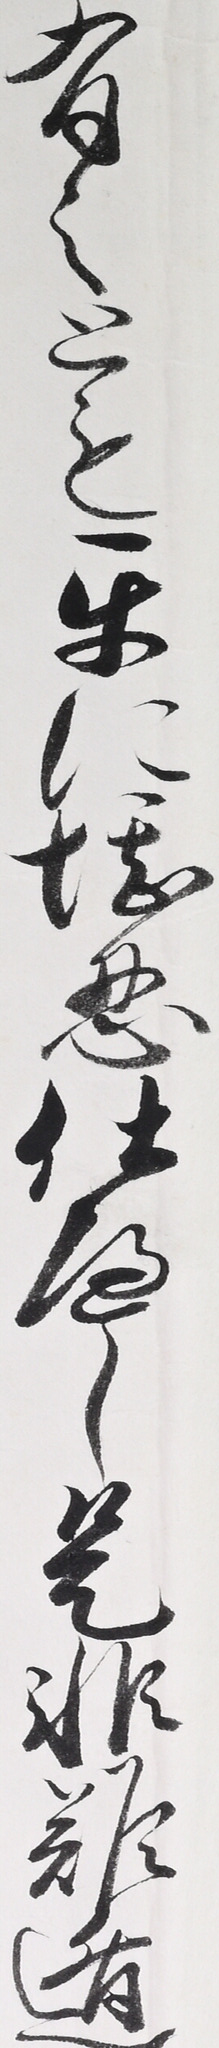有之とも互に堪忍仕へし是非難遁
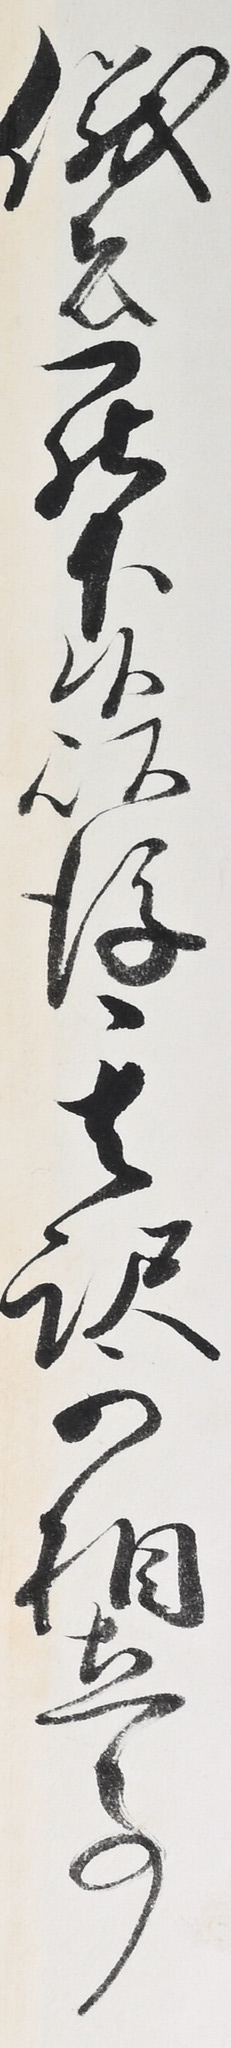儀者罷下候以後其訳可相立事
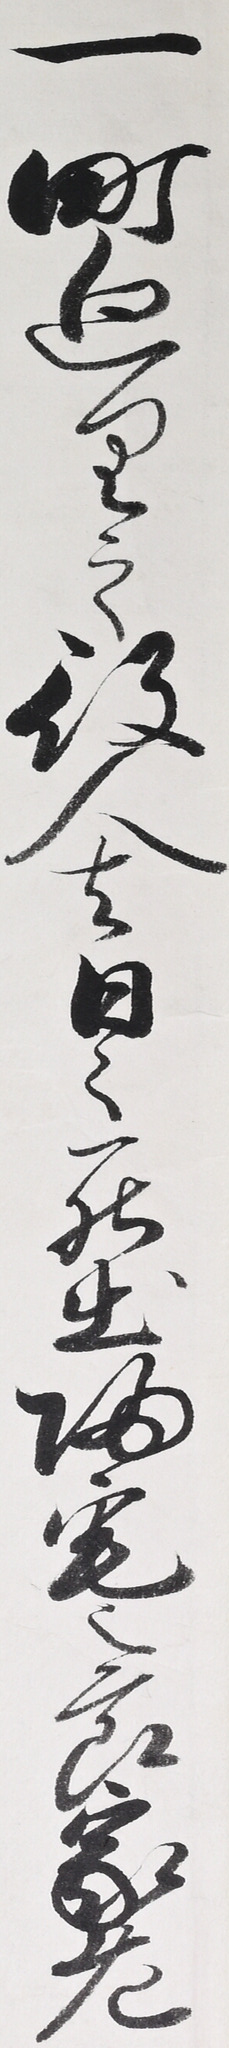一町廻り之役人者日々罷出帰宅之節家老
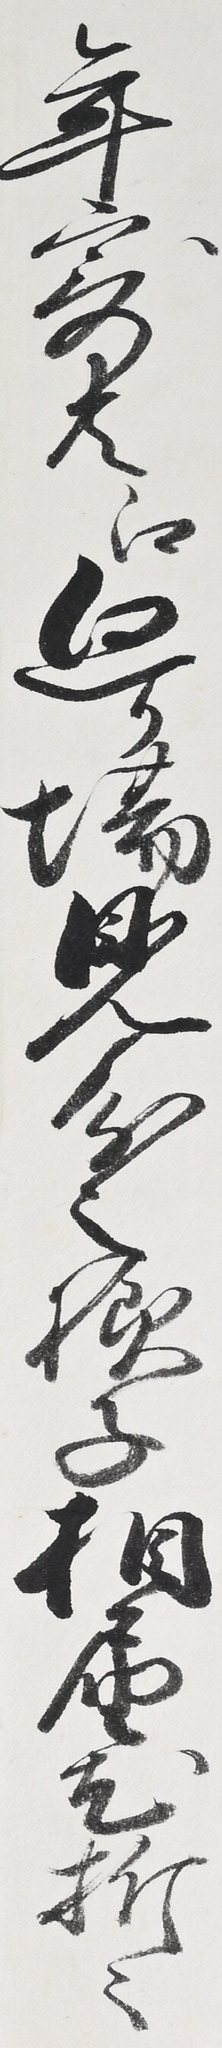年寄共江廻り場見分之様子相届尤折々
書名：御条目
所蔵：伊那市立高遠町図書館・合同会社AMANE
